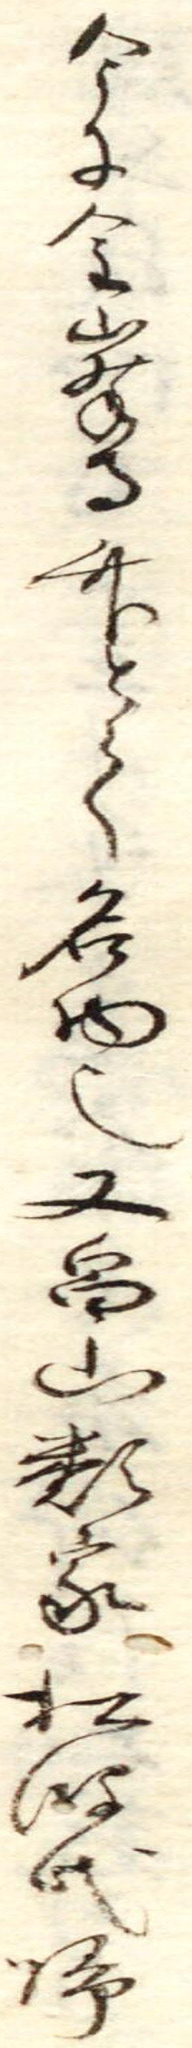今に金峰寺竹とて名物也又畠山類家松波氏帰
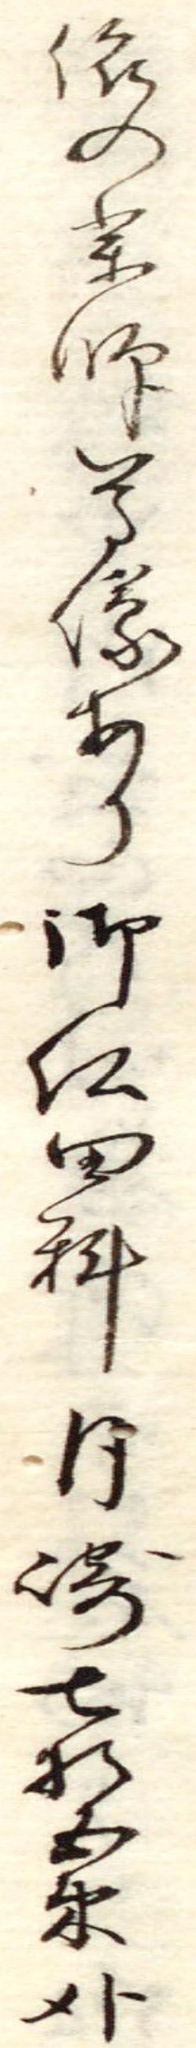依の薬師尊像あり御仏田料月崎七拾五束外
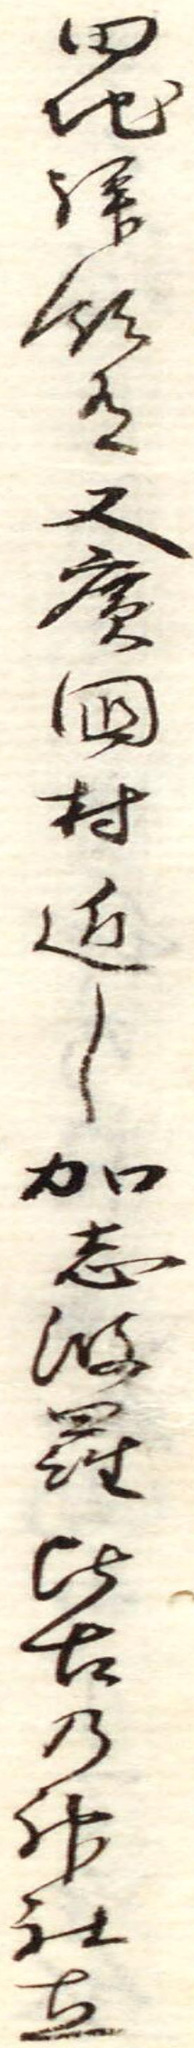田地拝領有又広国村近し加志波羅比古の神社立
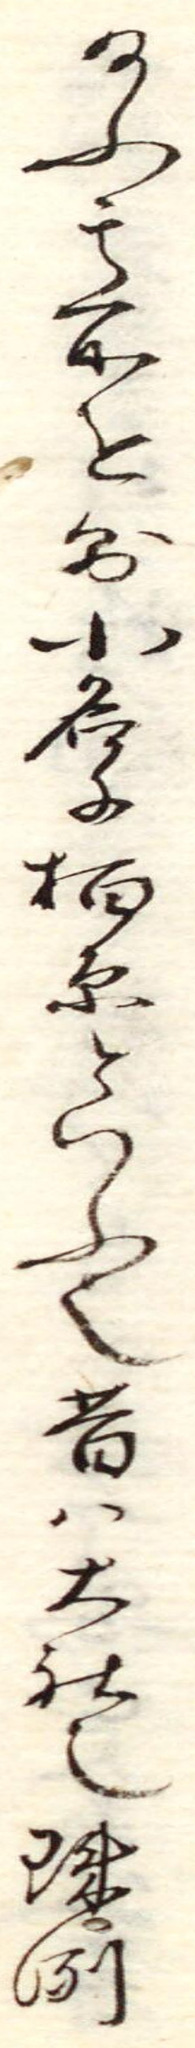給ふ其所を則小名子柏原といふ也昔は大社也珠洲
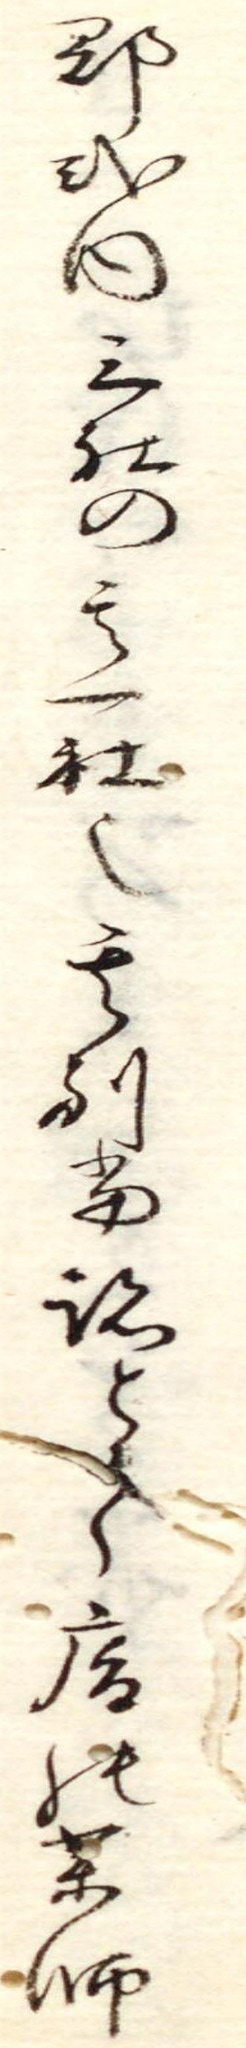郡式内三社の其一社也其別当跡とて庵の
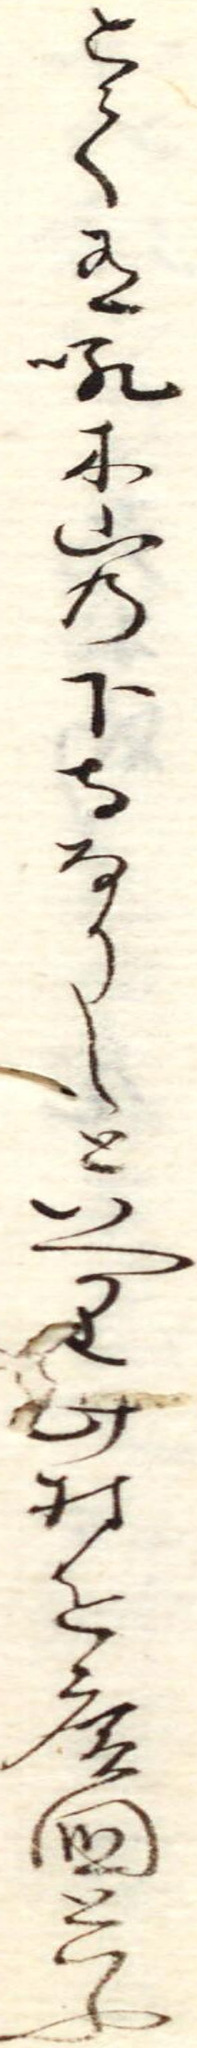とて有吼木山の下寺なりしといへり此村を広国といふ
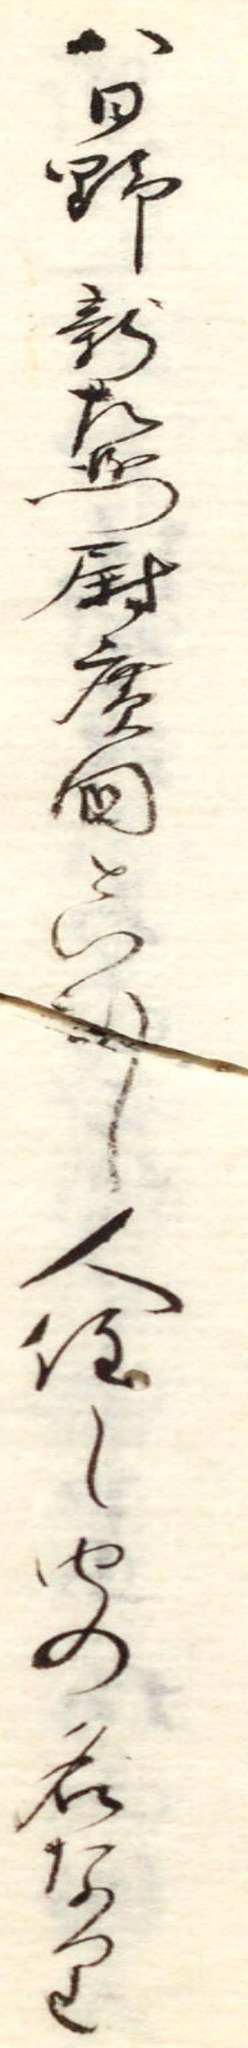は日野新左衛門尉広国といひし人住し由の名なり
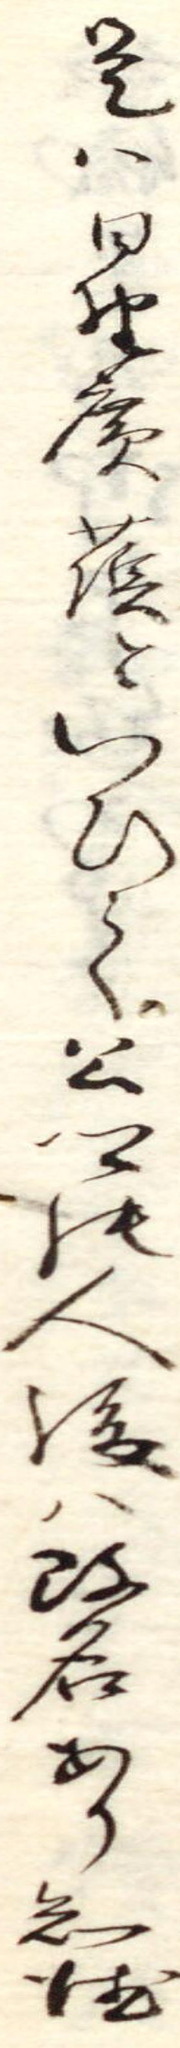是は日野広蔭といひて公卿の人後は改名あり知徳
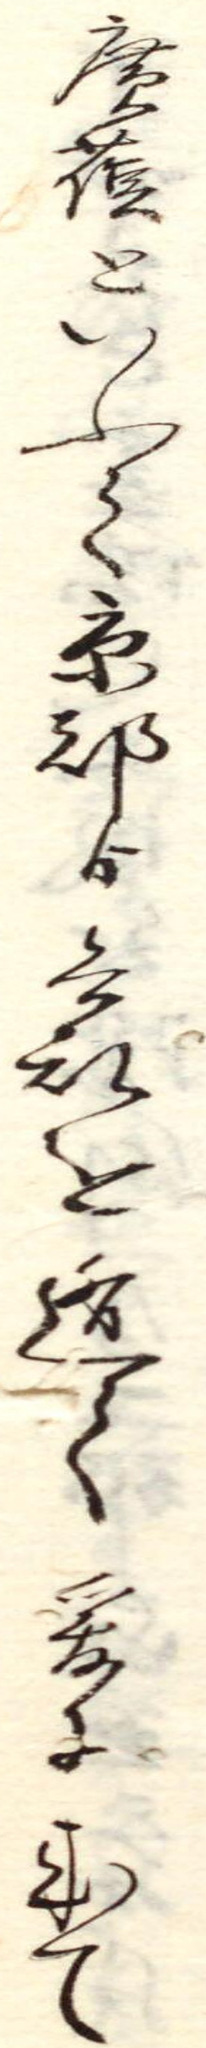広蔭といふて京都ゟ兵乱を遁て爰に来て
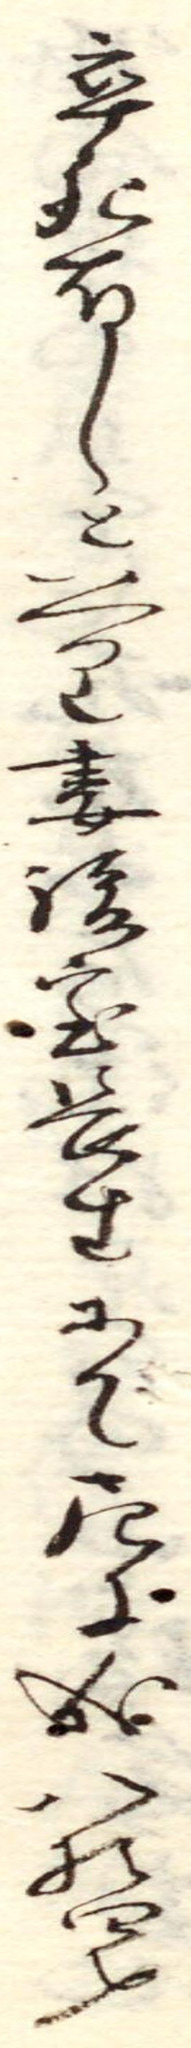卒死有しといへり妻清宝長生にて尼に成八拾四才
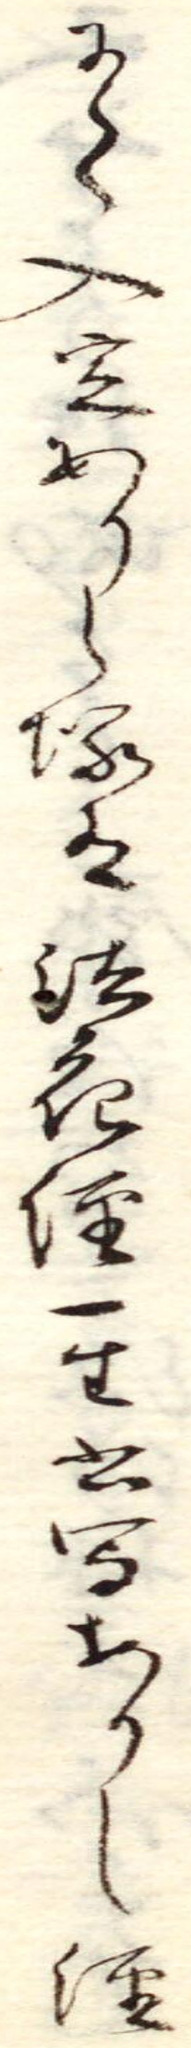にて入定ありし塚有法華経一生書写ありし経
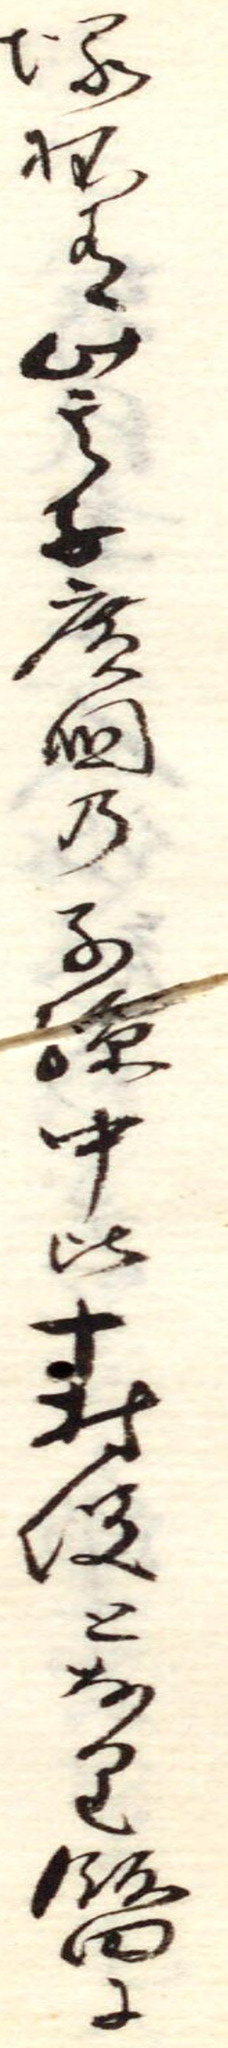塚抔有此其子広国の子孫中頃十村役となり飯田に
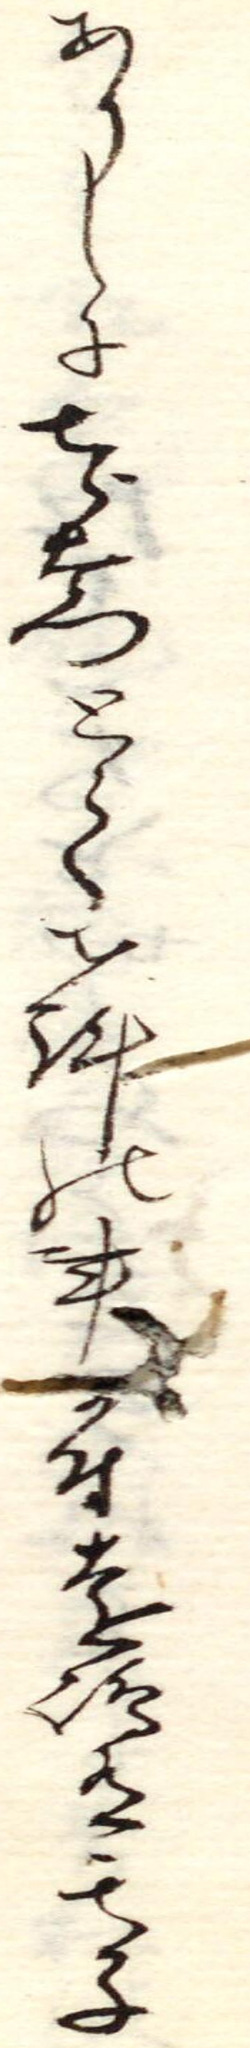ありしに七郎右衛門とて才科の事に付遠嶋有其子
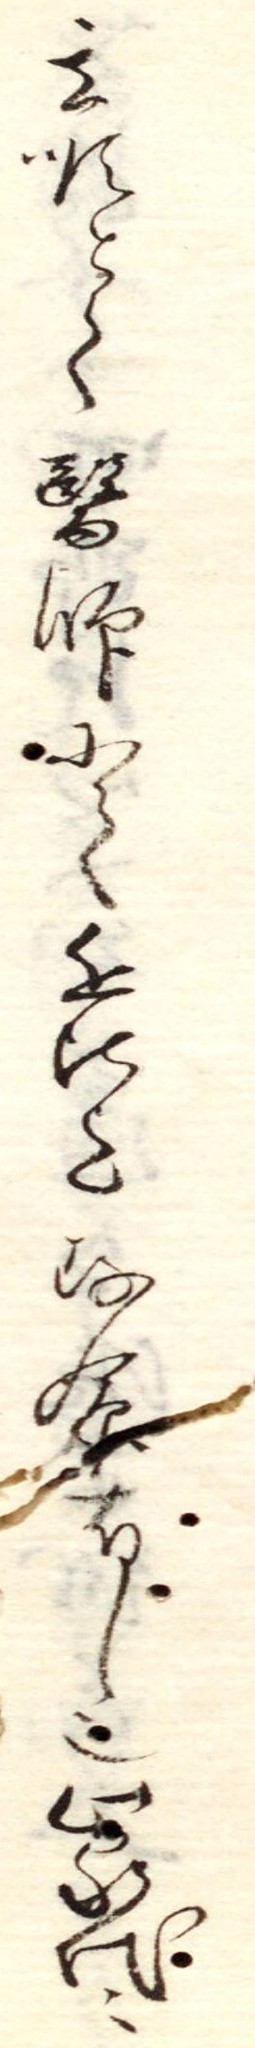玄順とて医師にて近頃迄存命有し也此家代々
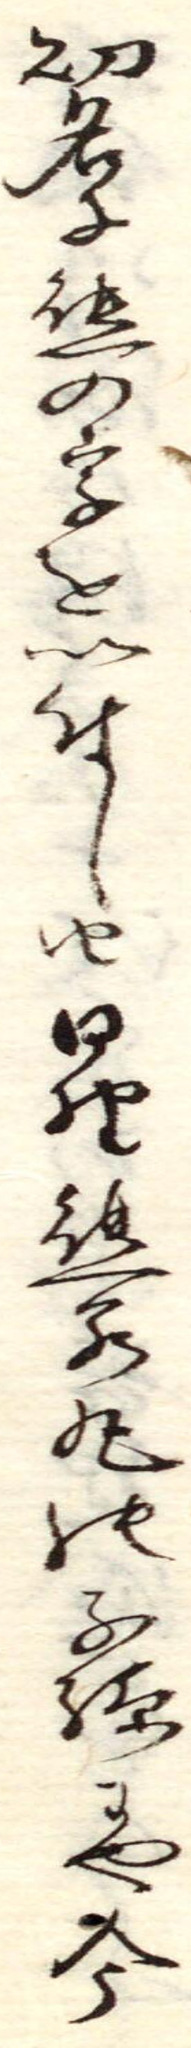幼名に熊の字を以付し由日野熊若丸の子孫にや今
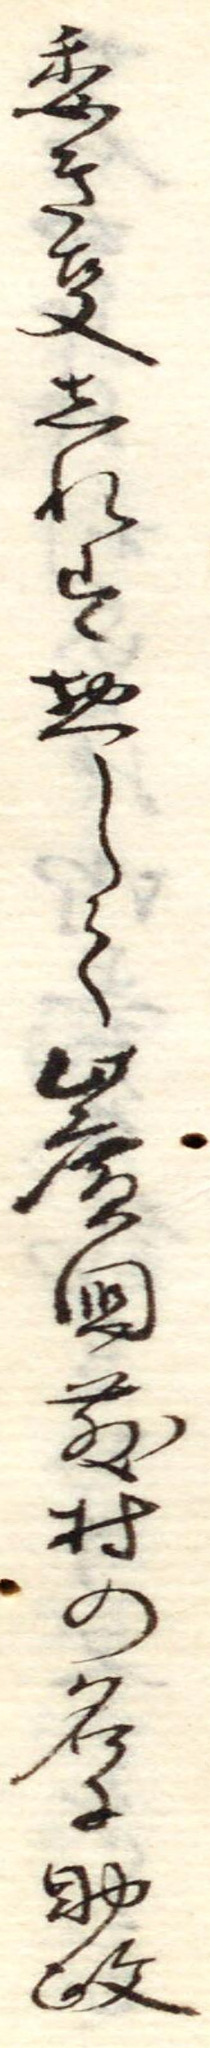委き事しれす惣して此広国散村の名に助政
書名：能登名跡誌
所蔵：Ishikawa Prefectural Library
